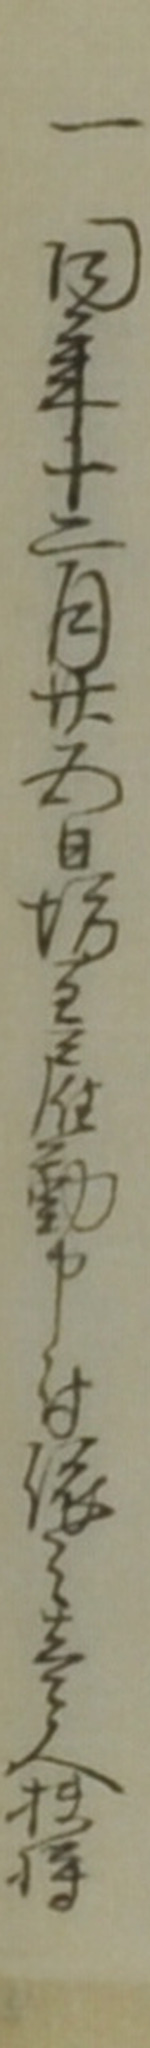一同年十二月廿五日坊主雇勤申付依之壱人扶持
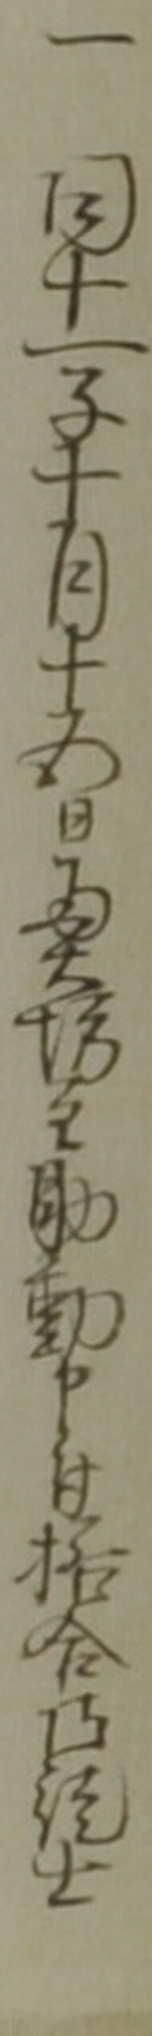一同十一子十月十五日奥坊主助勤申付格合御徒士
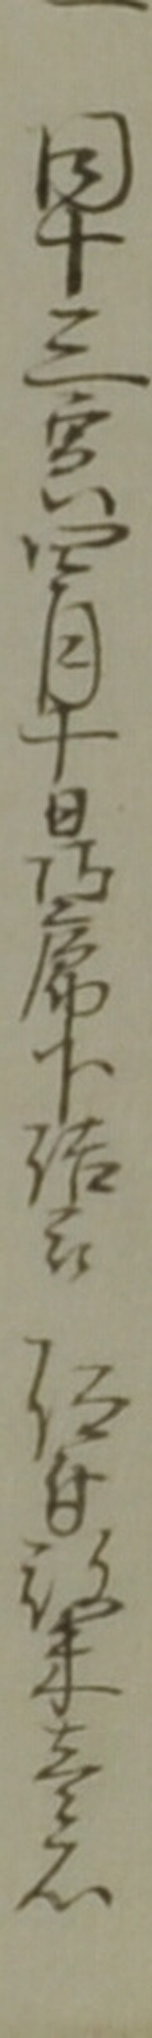一同十三寅四月十日御廊下詰被仰付役米壱石

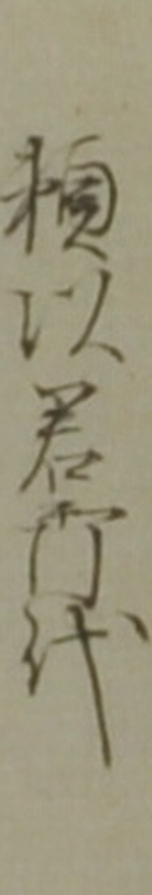頼以君御代
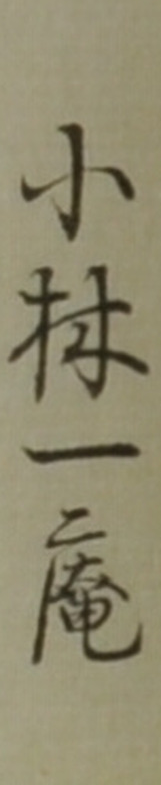小林一庵
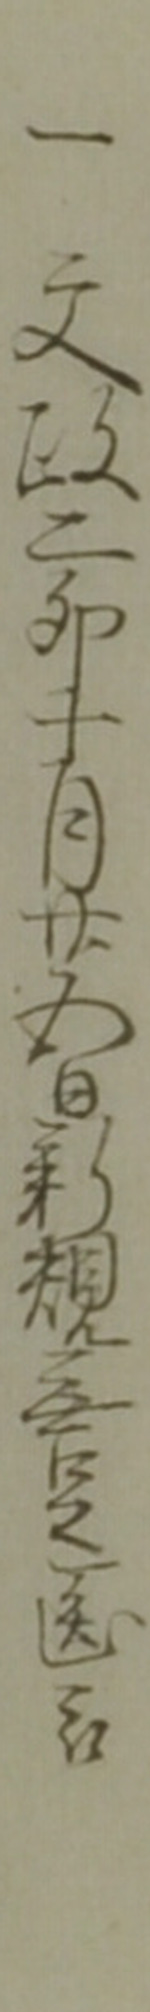一文政二卯十月廿五日新規無足医被
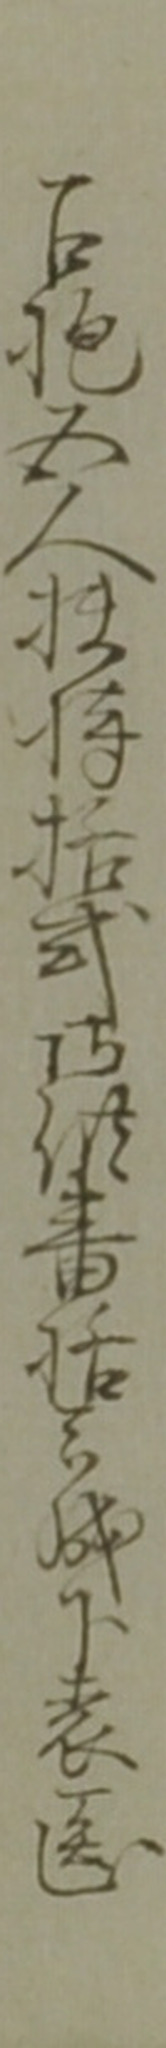召抱五人扶持格式御供番格被成下表医
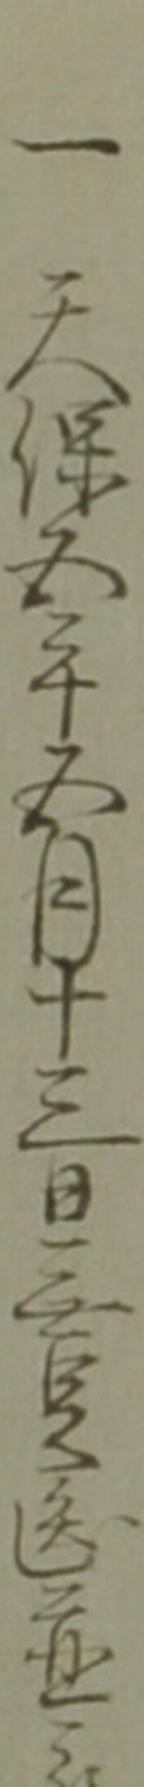一天保五午五月十三日無足医並被
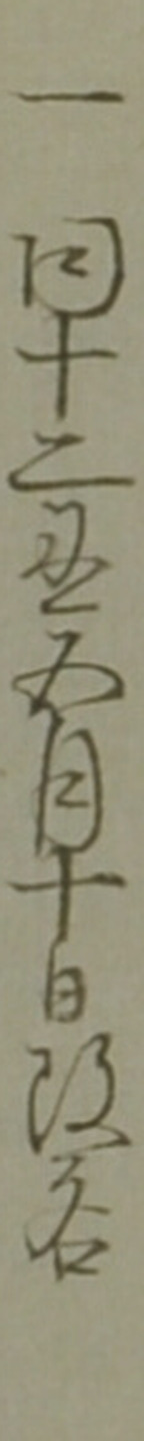一同十二丑五月十日改名
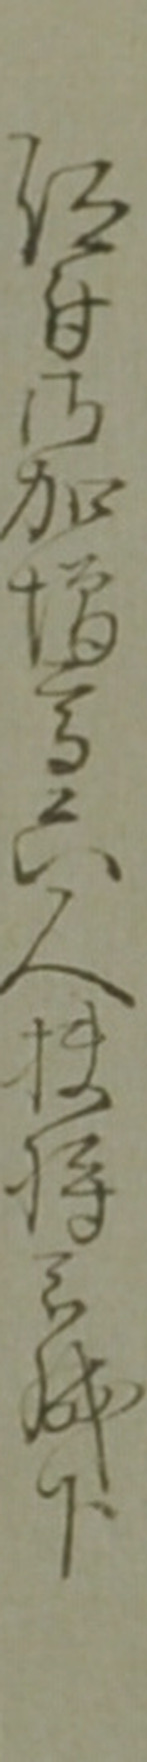仰付御加増高六人扶持被成下
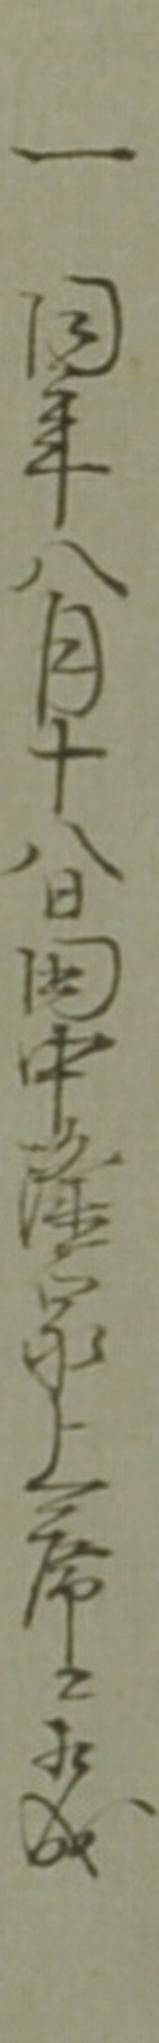一同年八月十八日田中隆家上席ニ相成
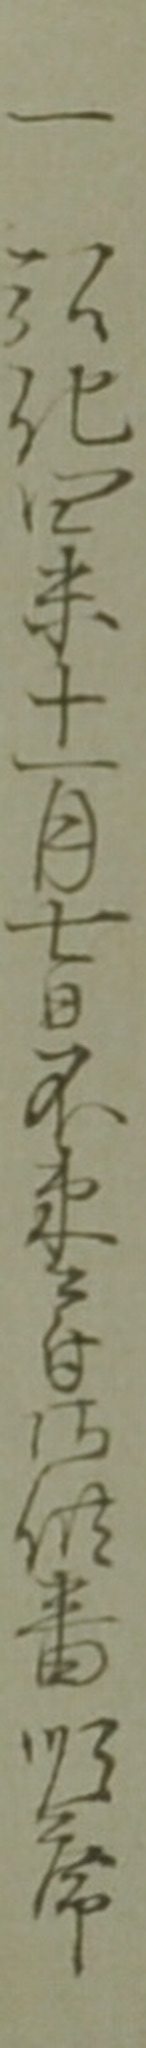一弘化四未十一月七日不束ニ付御供番順席
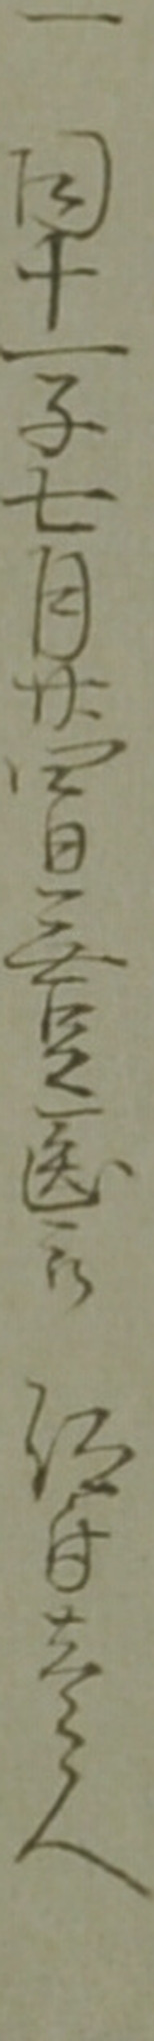一同十一子七月廿四日無足医被仰付壱人
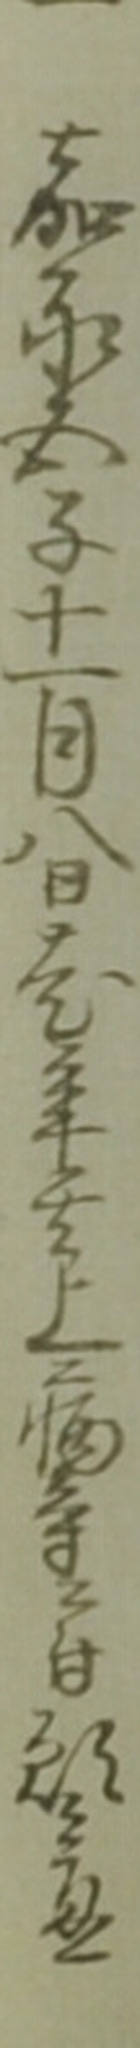一嘉永五子十一月八日老年其上病気ニ付願之通

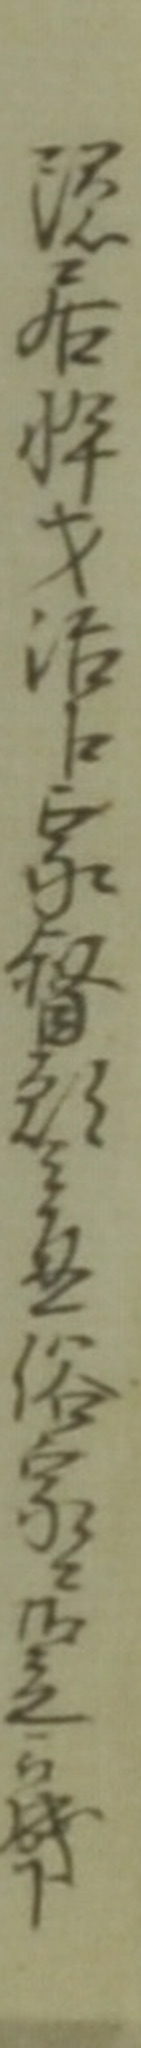隠居忰才治江家督願之通俗家ニ御立被成下
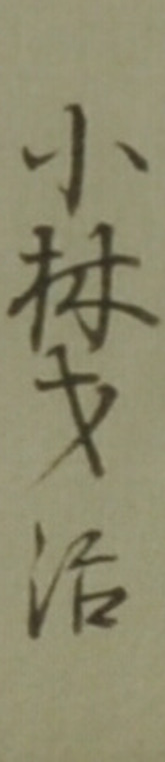小林才治
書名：無足諸士勤仕録（三）
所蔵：伊那市立高遠町図書館・合同会社AMANE
